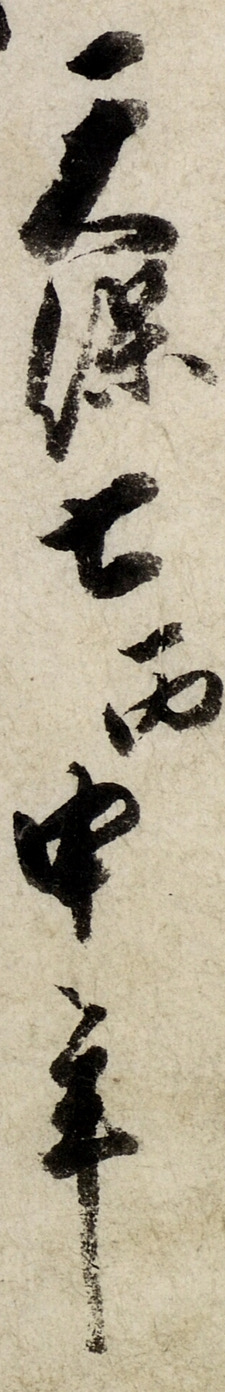天保七丙申年
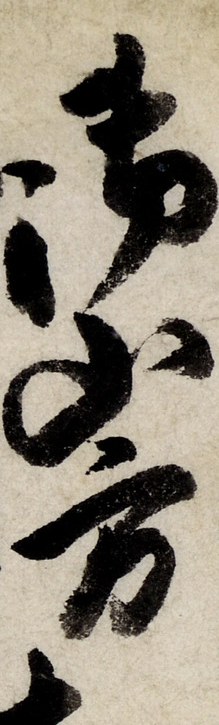御山方
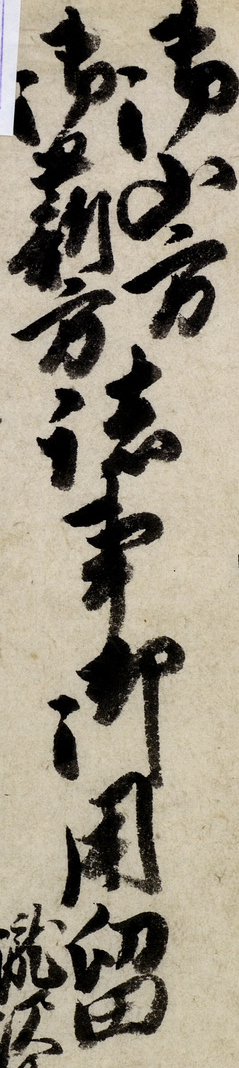御薪方諸事御用留
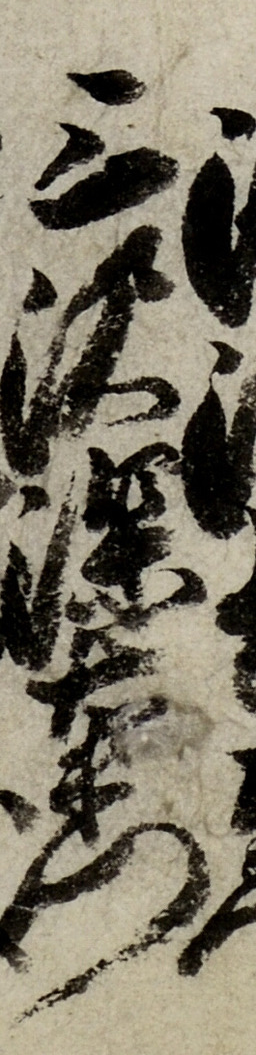三沢深右衞門
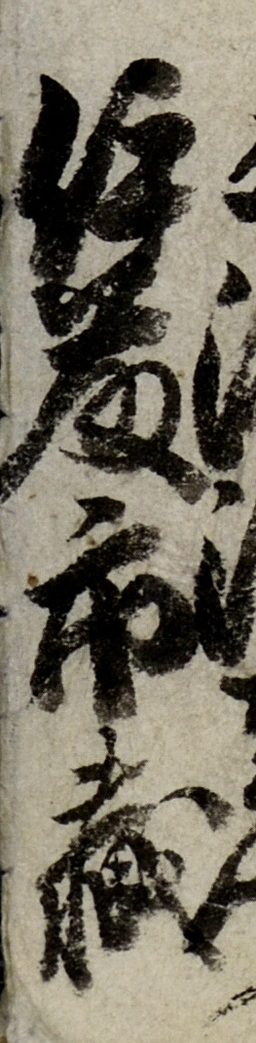伊藤市蔵
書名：御山方御薪方諸事御用留
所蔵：伊那市立高遠町図書館・合同会社AMANE
